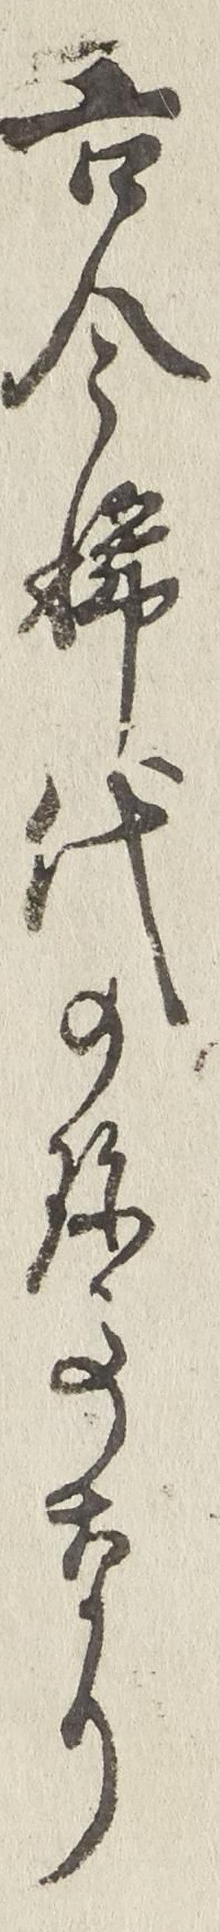古今稀代の珍事なり
